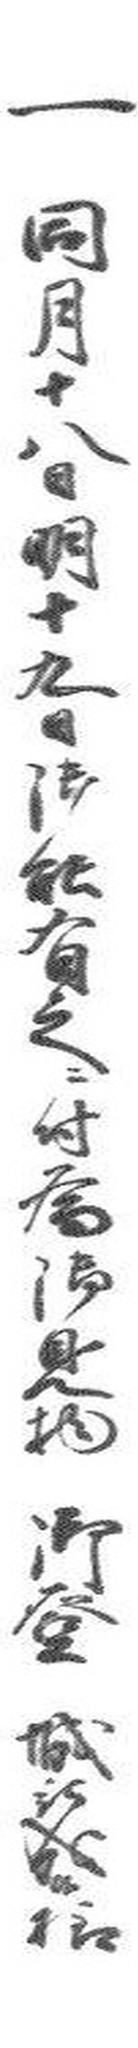一同月十八日明十九日御能有之ニ付為御見物御登城被成候様
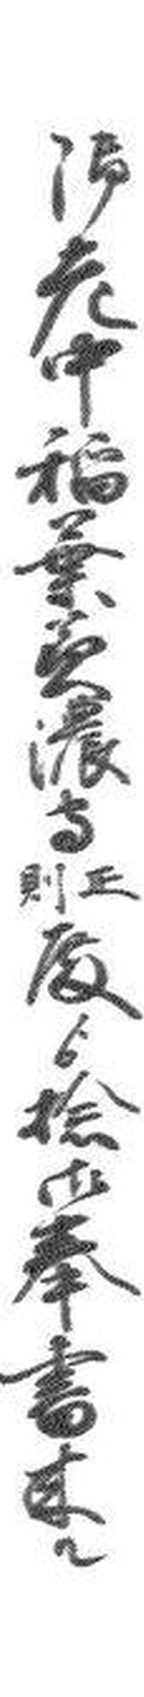御老中稲葉美濃守正則殿ゟ捻御奉書来ル
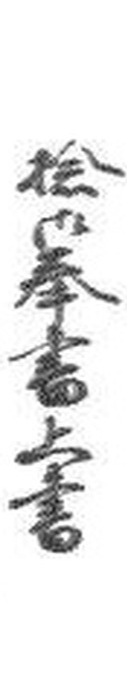捻御奉書上書
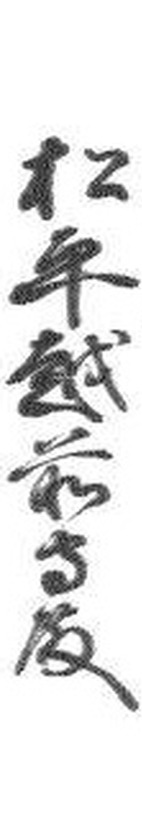松平越前守殿正則
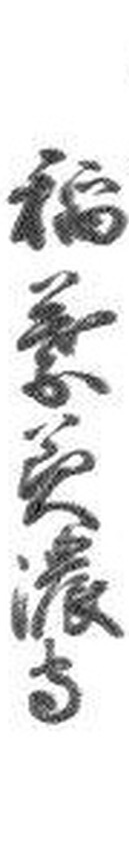稲葉美濃守
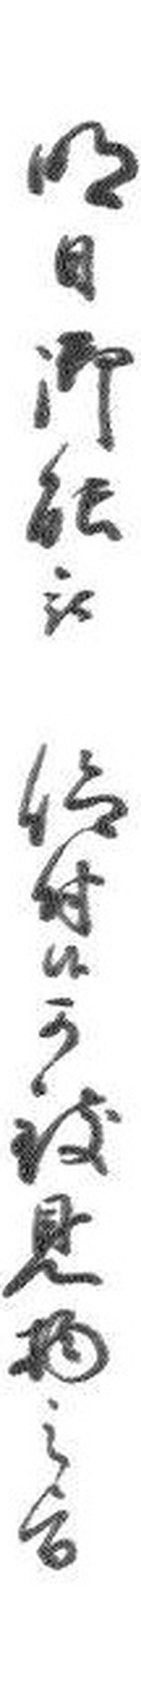明日御能被仰付候可致見物之旨
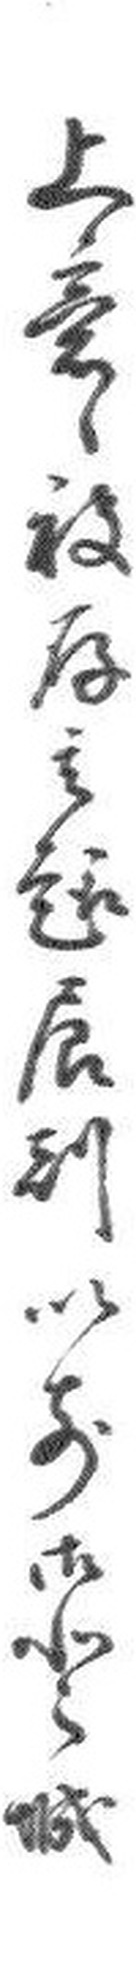上意候被存其趣辰刻以前御登城
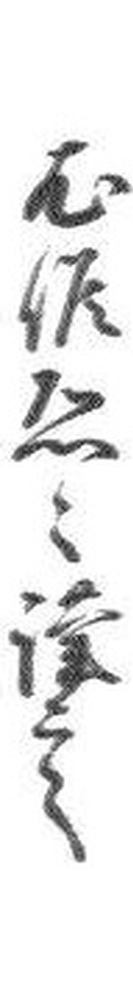尤候恐々謹言

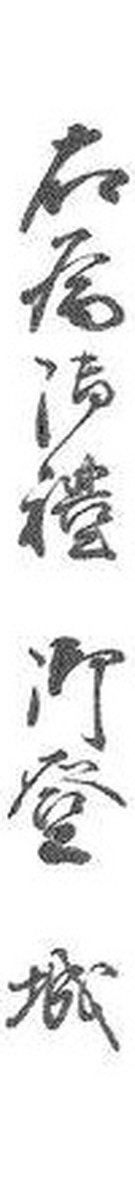右為御礼御登城
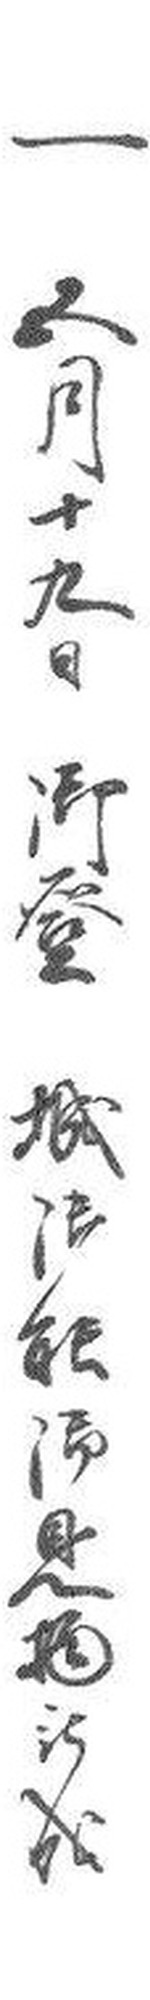一五月十九日御登城御能御見物被成
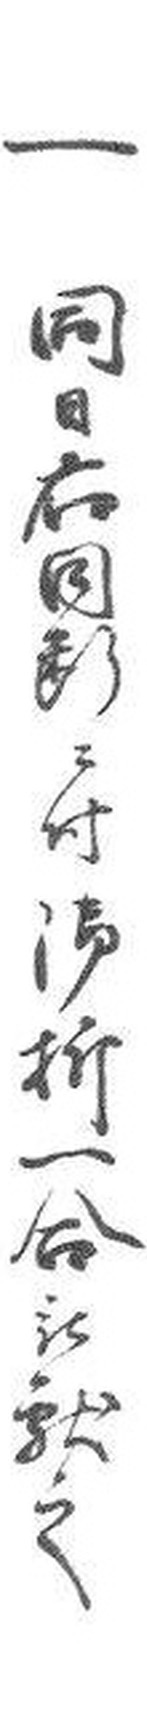一同日右同断ニ付御折一合被献之
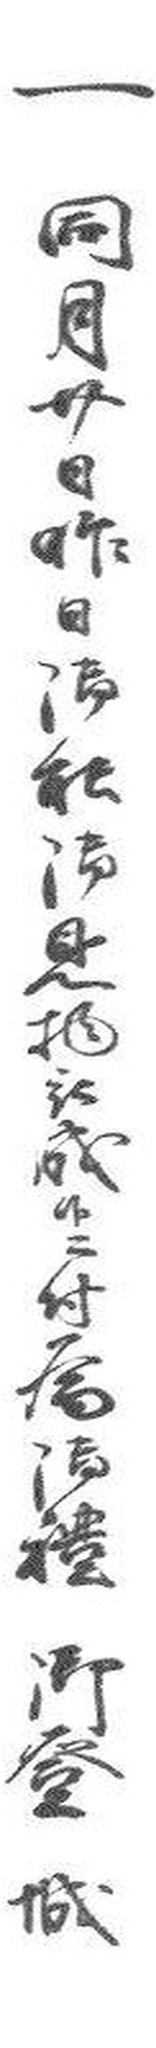一同月廿日昨日御能御見物被成候ニ付為御礼御登城
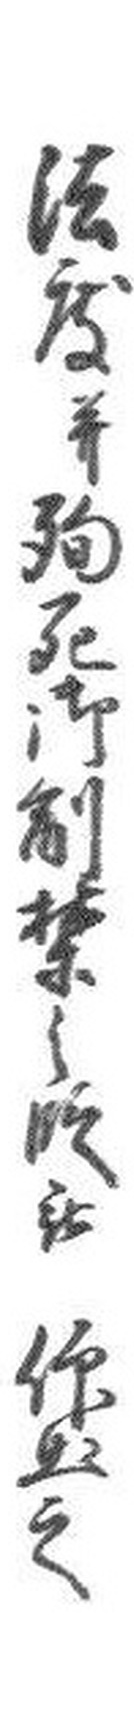法度并殉死御制禁之段被仰出之
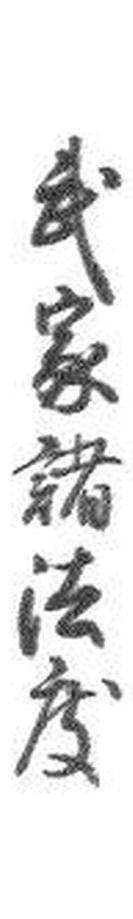武家諸法度
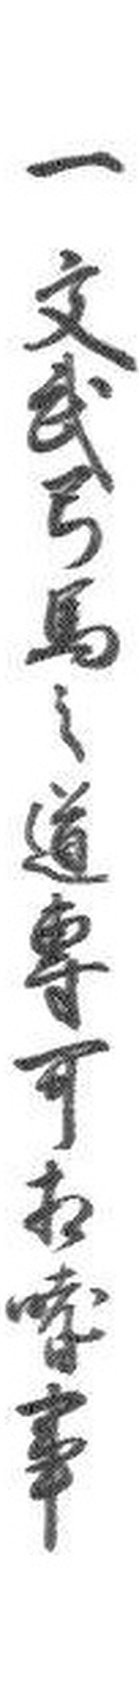一文武弓馬之道専可相嗜事
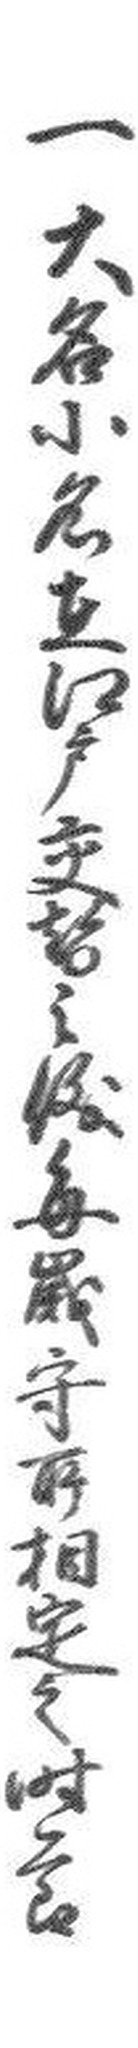一大名小名在江戸交替之儀毎歳守所相定之時節
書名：家譜 六 光通公 従万治三年到寛文三年
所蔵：福井県文書館 Fukui Prefectural Archives
